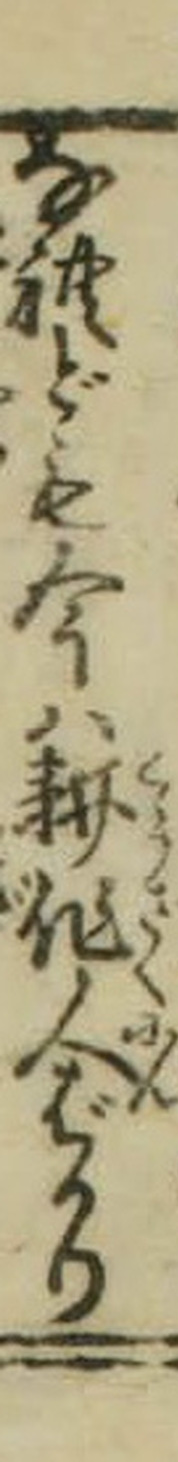なれども今は耕作人ばかり
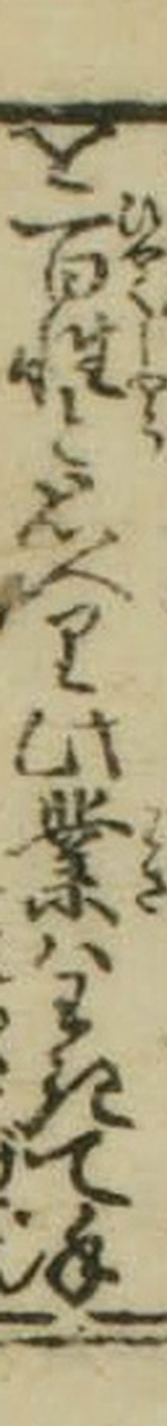を百姓といへり此業はわきて手
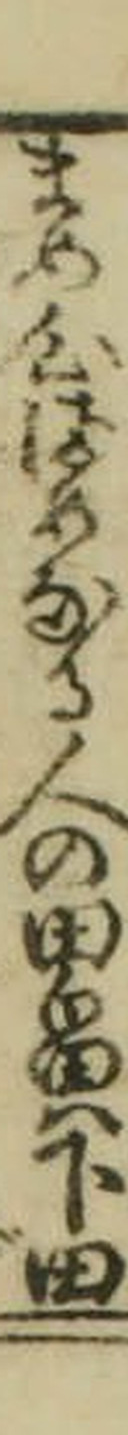まめ心まめなる人の田畠は下田
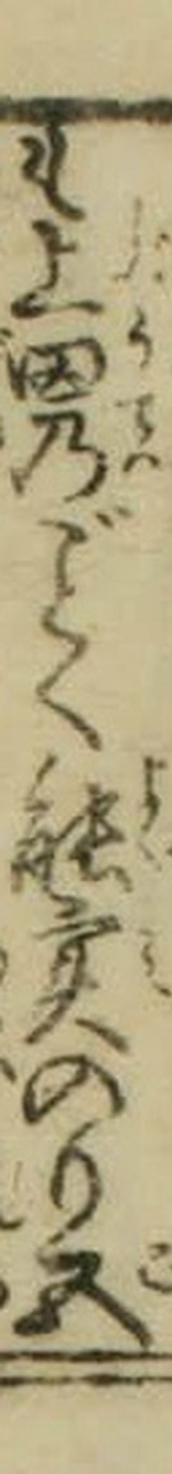も上田のごとく能実のり五
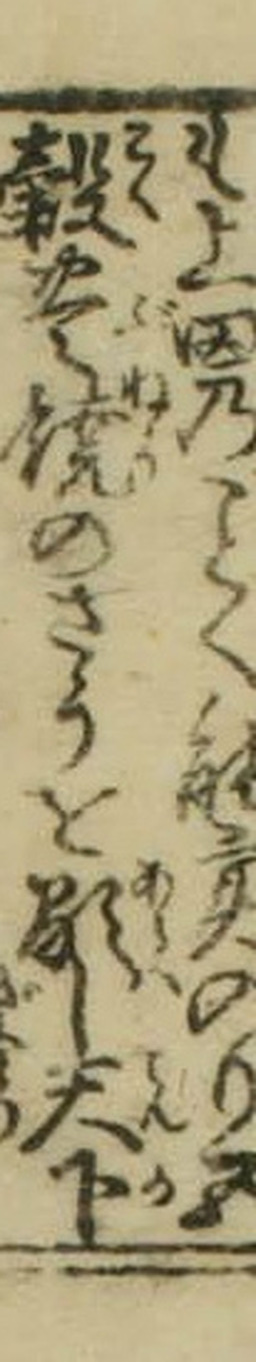穀豊穣のさうを顕し天下
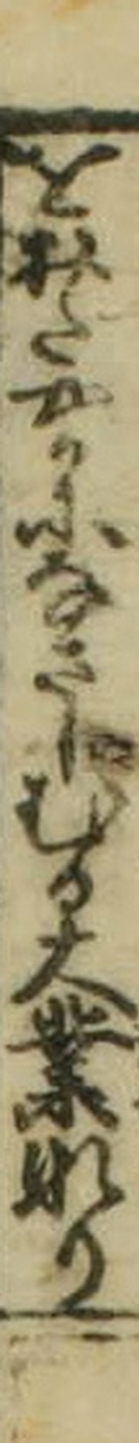をおたやかになさしむる大業なり
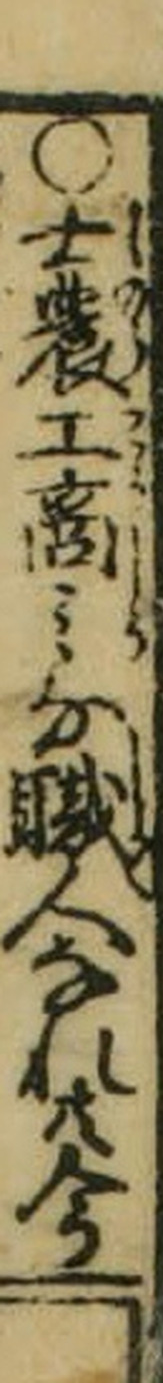〇士農工商みな職人なれと今
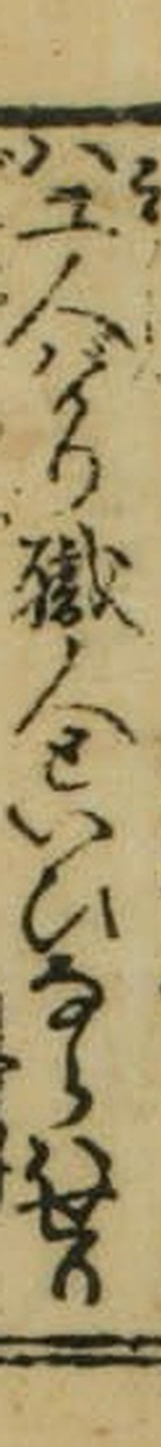は工人ばかり職人といひならはせり
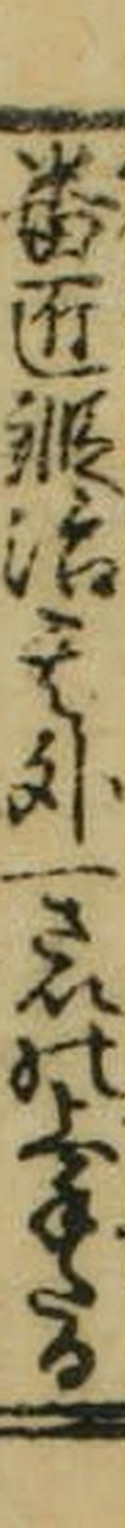番匠鍛冶其外一さいの上手たる
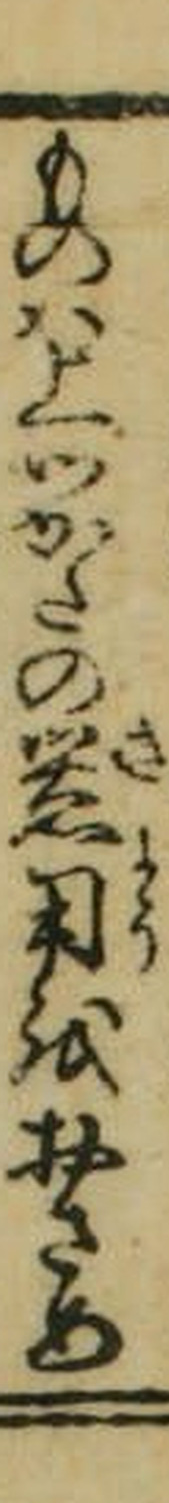ものはつかたの器用をおさめ
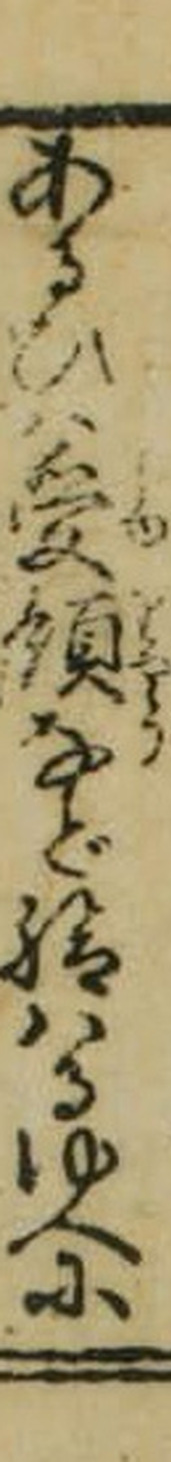あるひは受領など給はるゆへに
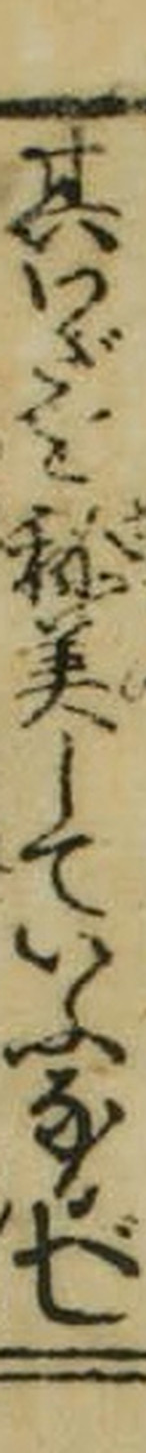其わざを称美していふなるべし
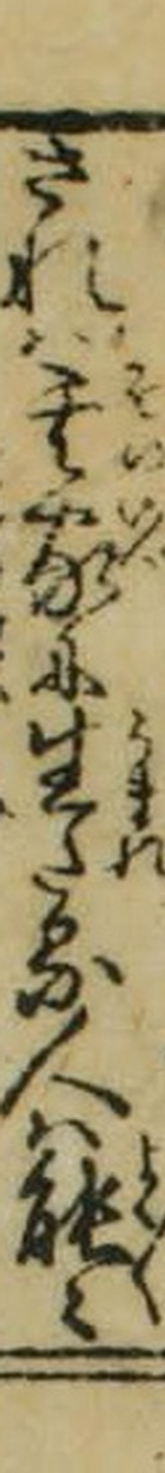されは其家に生たる人は能々
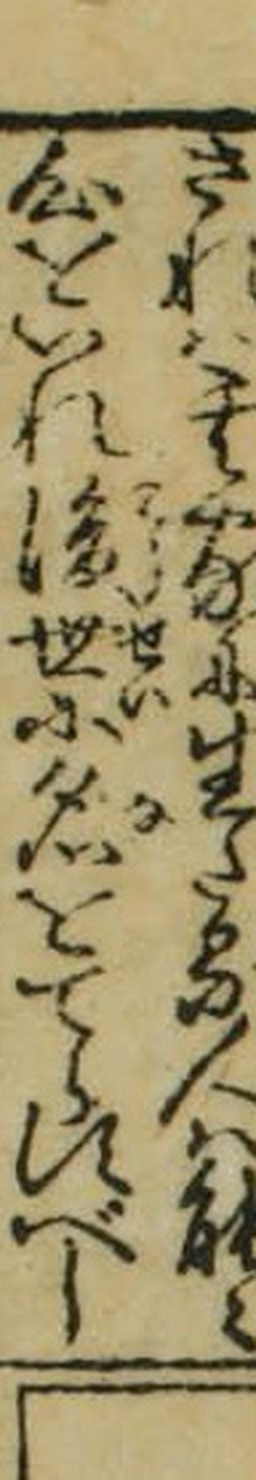心をいれ後世に名をてらすべし
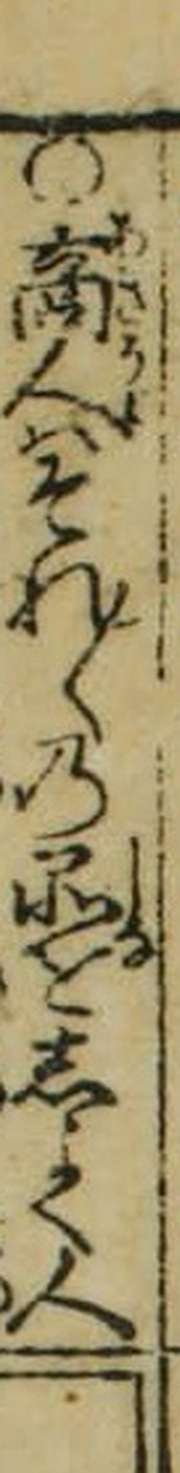〇商人はそれ〳〵の品をして人
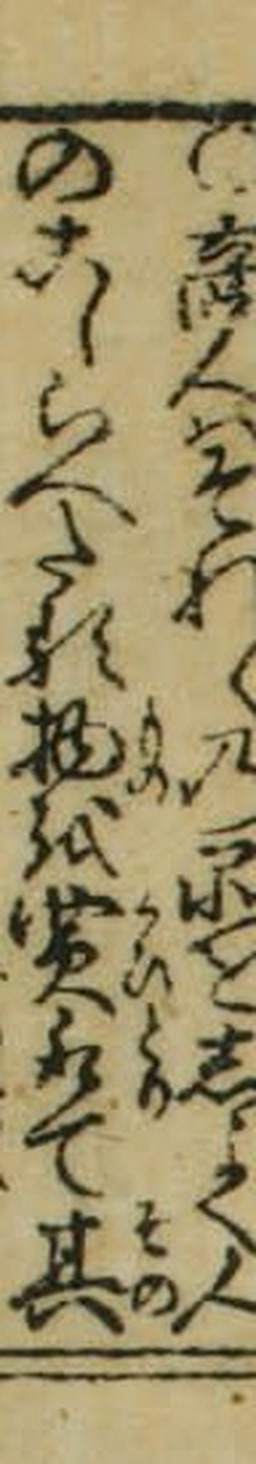のこしらへたる物を買取て其
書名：増補職人往来
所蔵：東京学芸大学教育コンテンツアーカイブ
